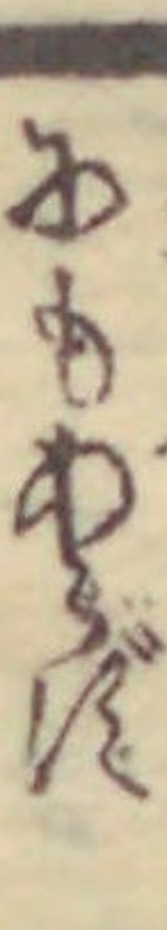にもあらず
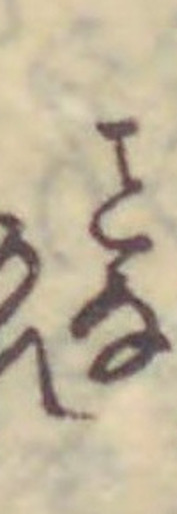ことな
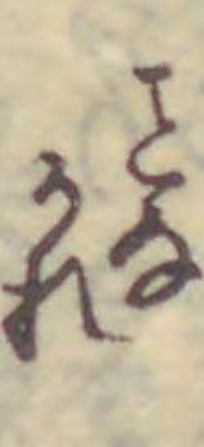ことな
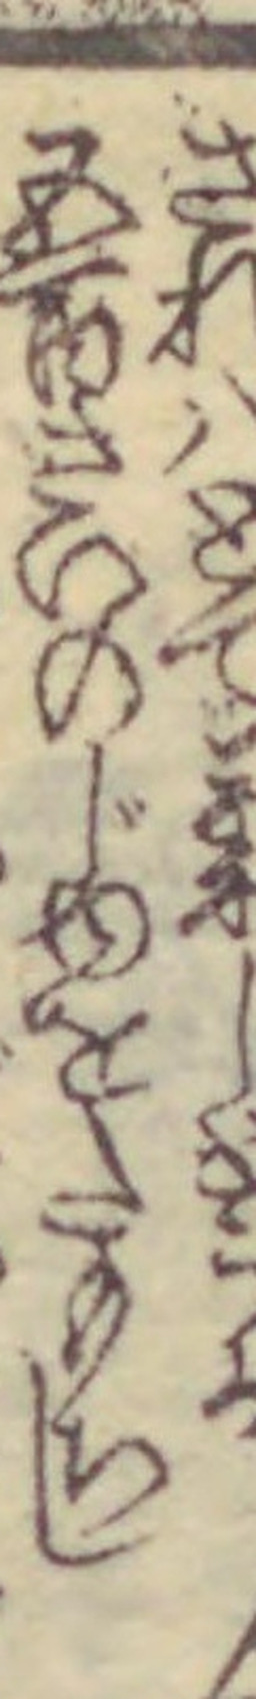五百さいのじゆをたもちし
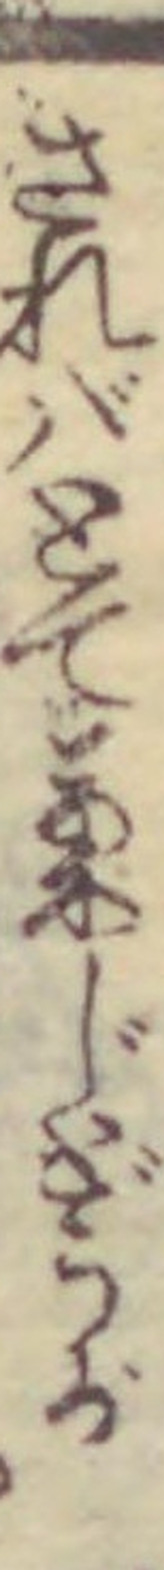さればとて菊じどうが
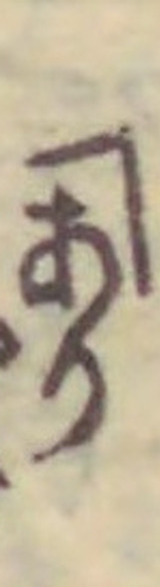〽あり
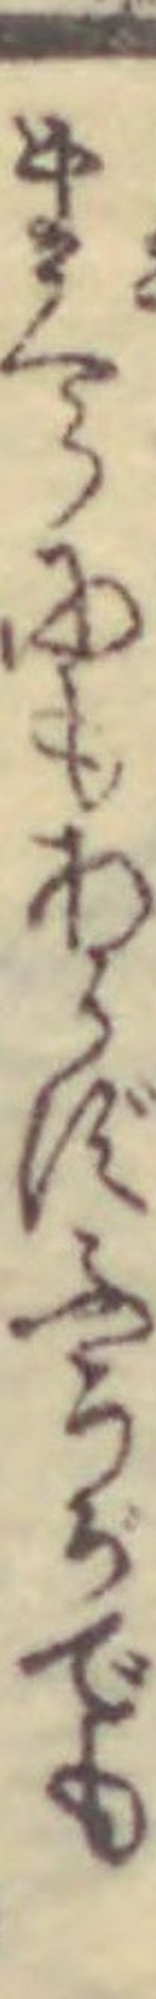まくらにもあらずふうがでも
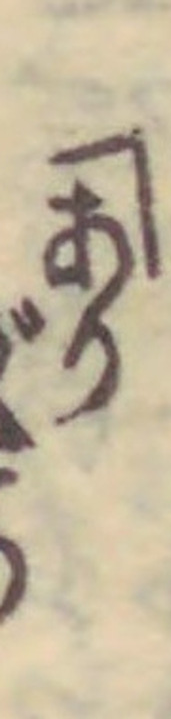〽あり
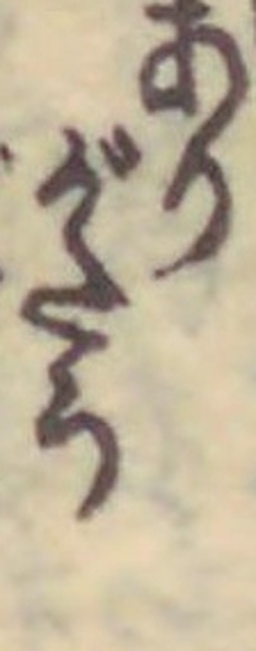がたう
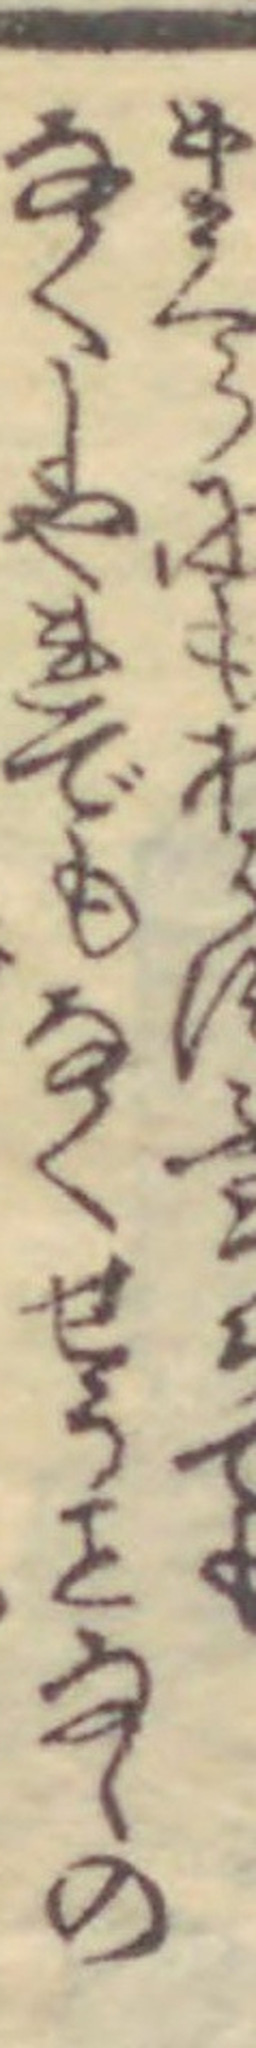なくしやれでもなくせうことなしの
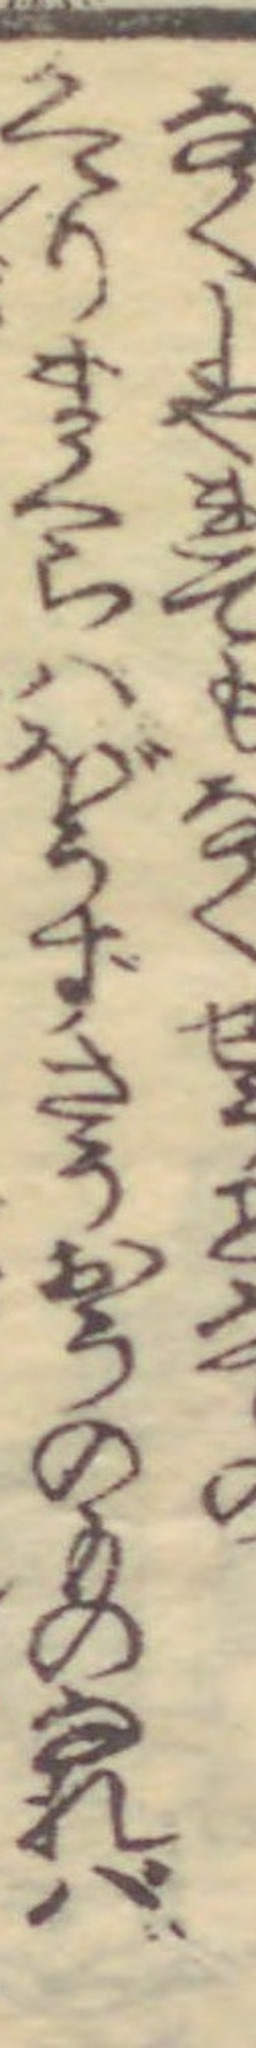くゝりまくらはぼうずさうおうのものなれば
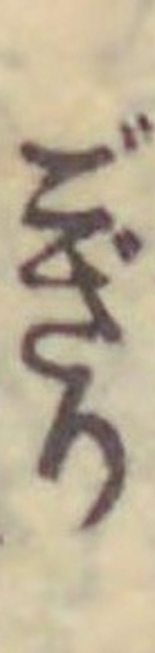ござり
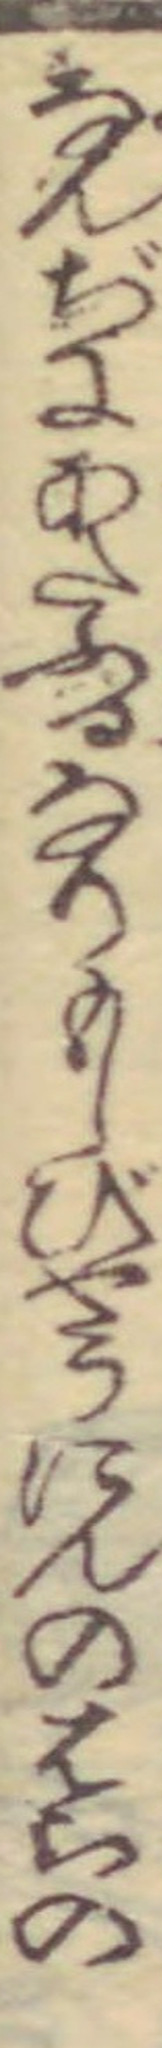なんぢにあたふるなりもしびやうにんのはらの
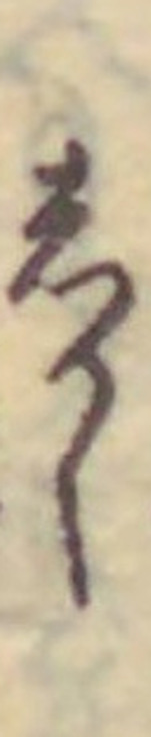しかし
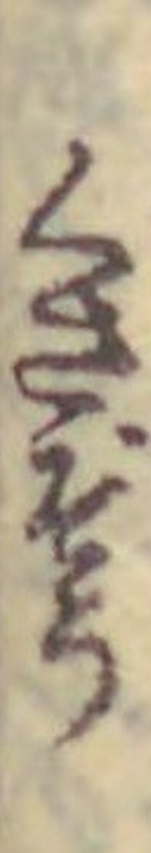くさぞう
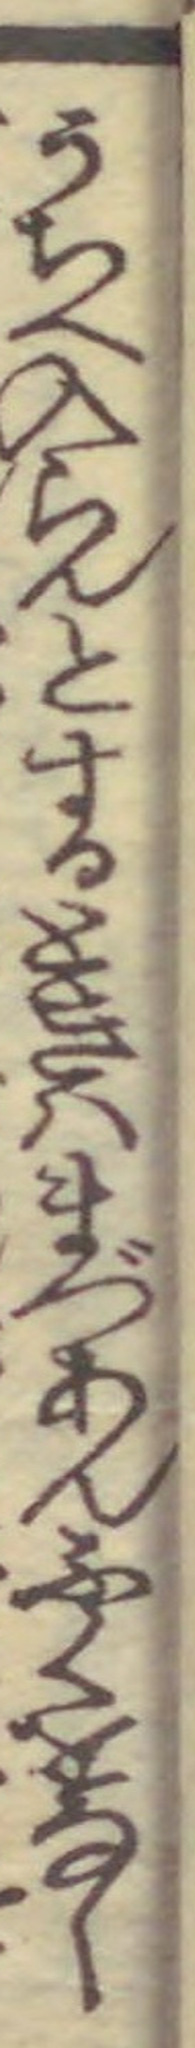うちへ入らんとするときはまづあんふくをなし
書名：腹内窺機関 2巻
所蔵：国立国会図書館 National Diet Library, JAPAN
